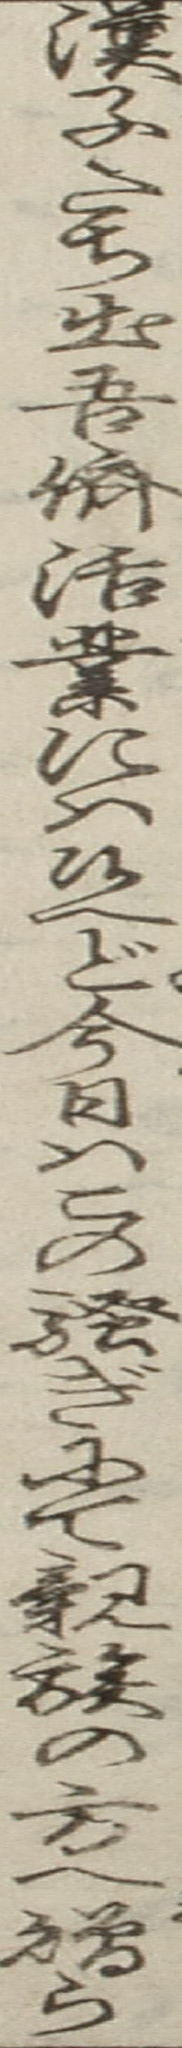漢子たち出。吾儕活業には候へど。今日はこの騒ぎにて親族の方へ贈ら
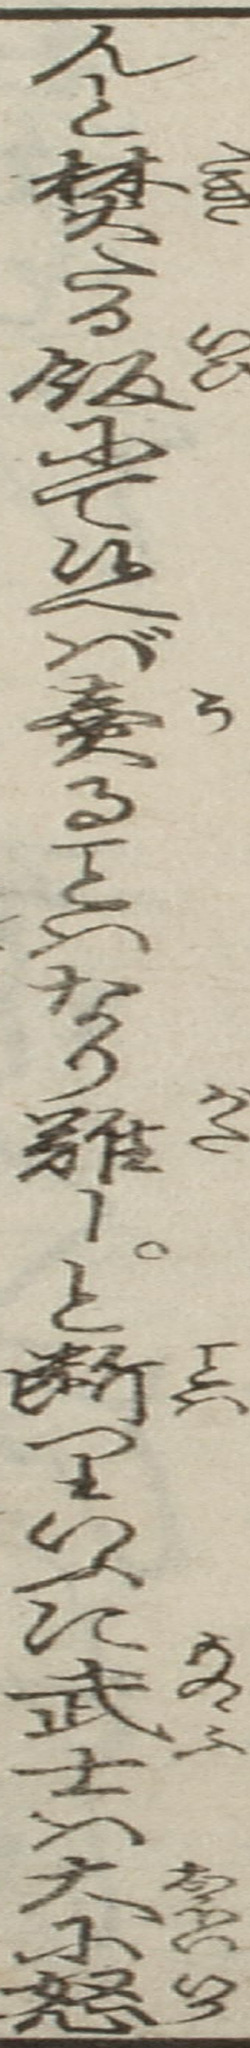んと焚たる飯にて候へば売ることはなり難し。と断りいふに武士は大に怒
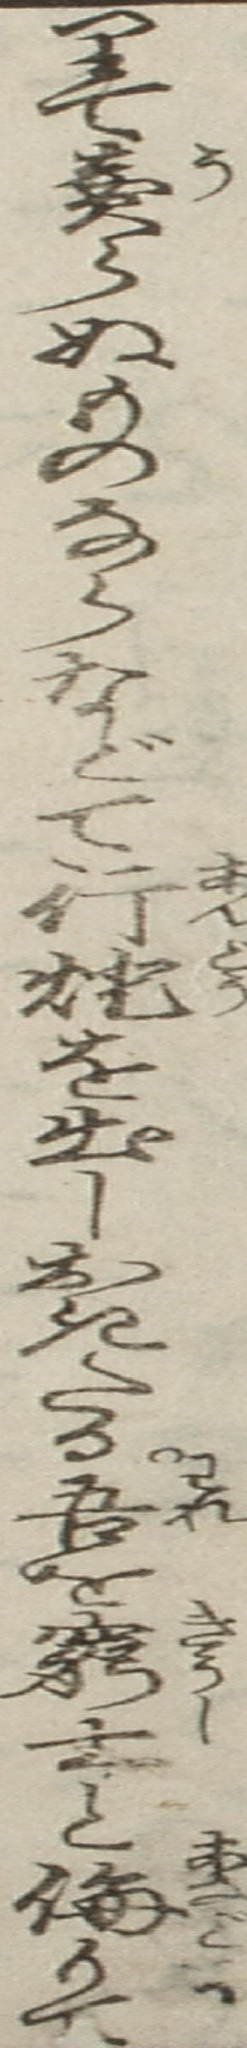りて売らぬものならなどて行燈を出しおきたる。吾を窮士と侮りて
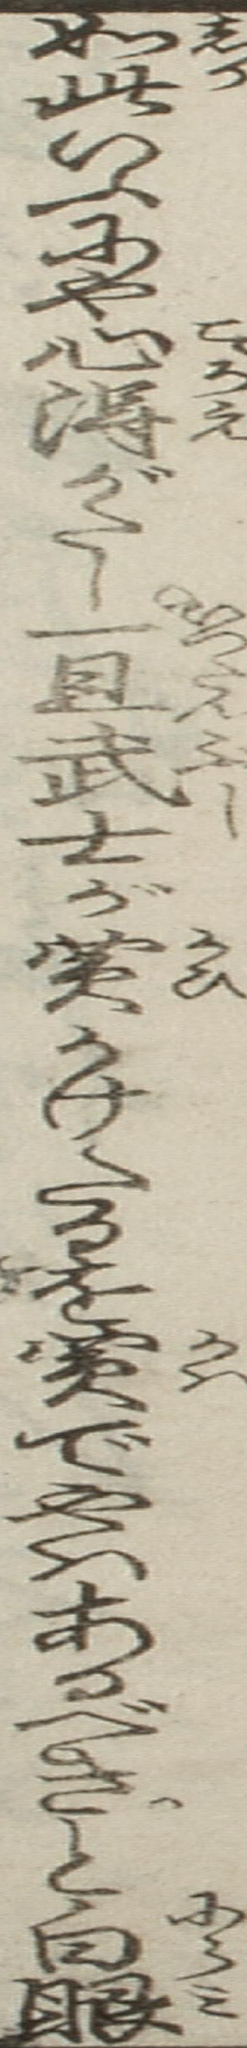如此いふにや心得がたし。一旦武士が買うけたるを買でやはあるべき。と白眼
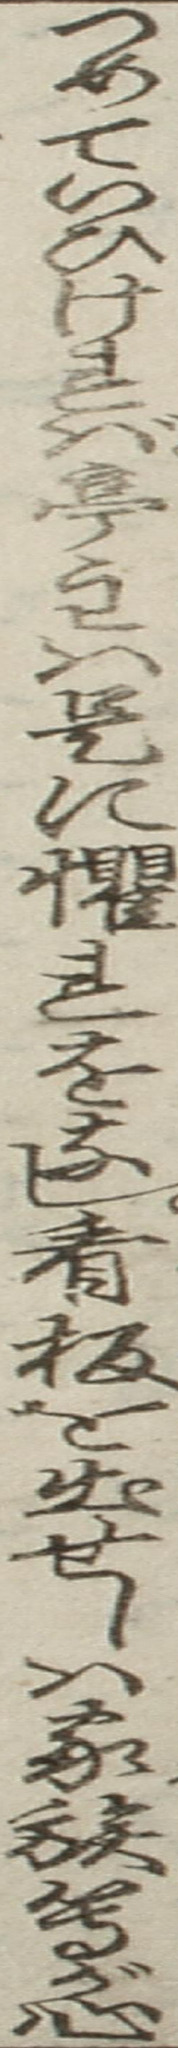つめていひければ。亭主は是に懼れをなし。看板を出せしは家族等が心
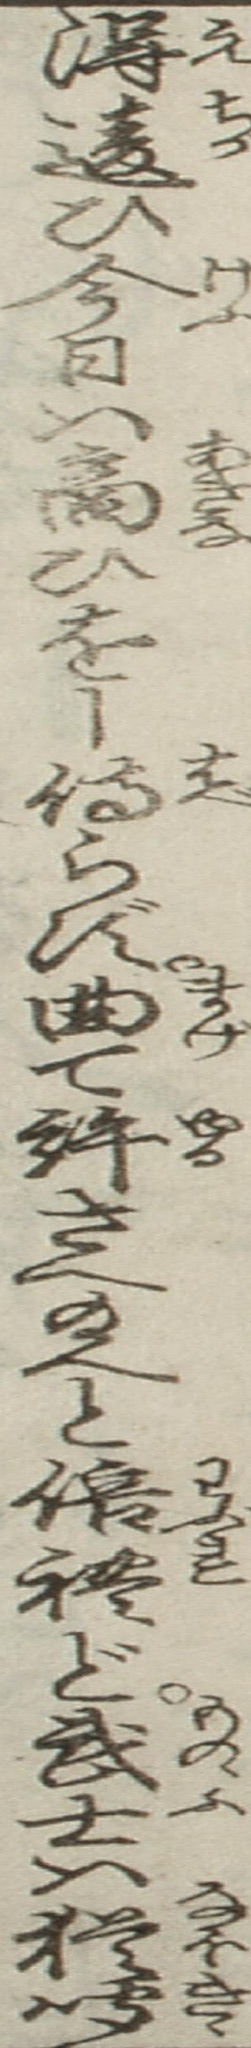得違ひ今日は商ひをし侍らず。曲て許さへ給へと倍礼ど。武士は猶聞
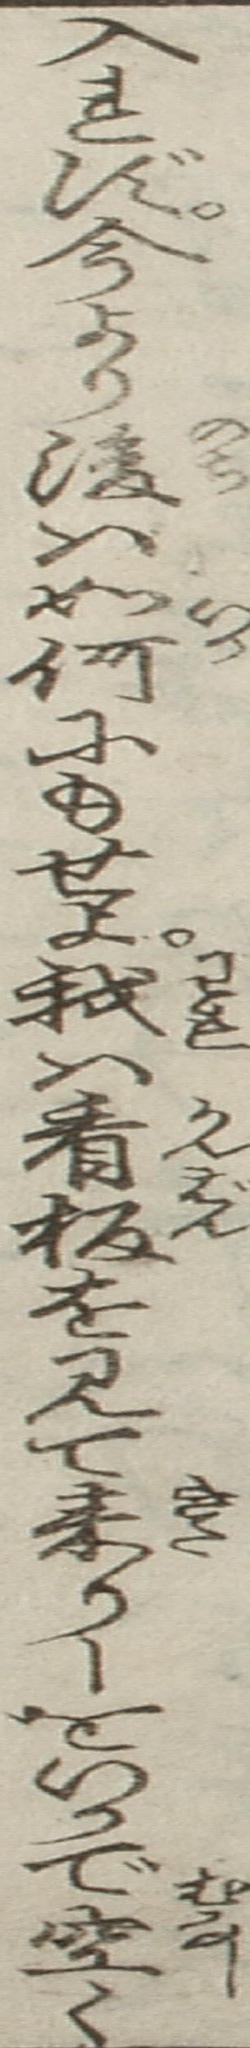入れず。今より後は如何にもせよ。我は看板を見て来りしをいかで空く
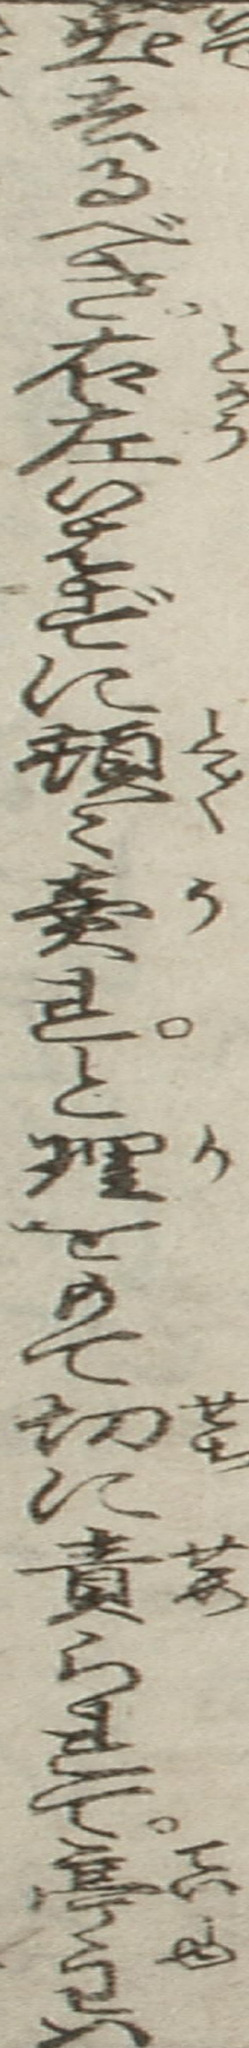出去るべき。右左いはずに頓々売れ。と理をもて切に責られて。亭主は
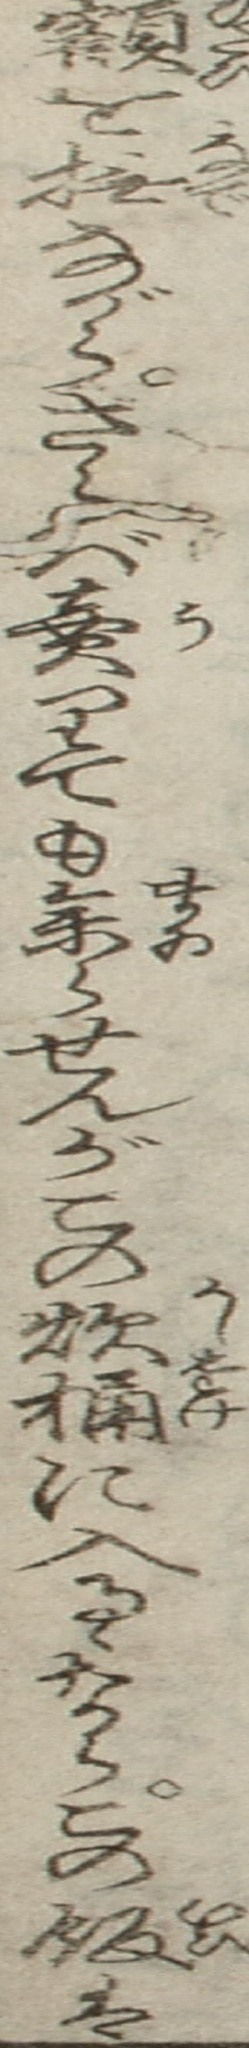額を撫ながら。さらば売りても参らせんがこの炊桶に入るゝなら。この飯は

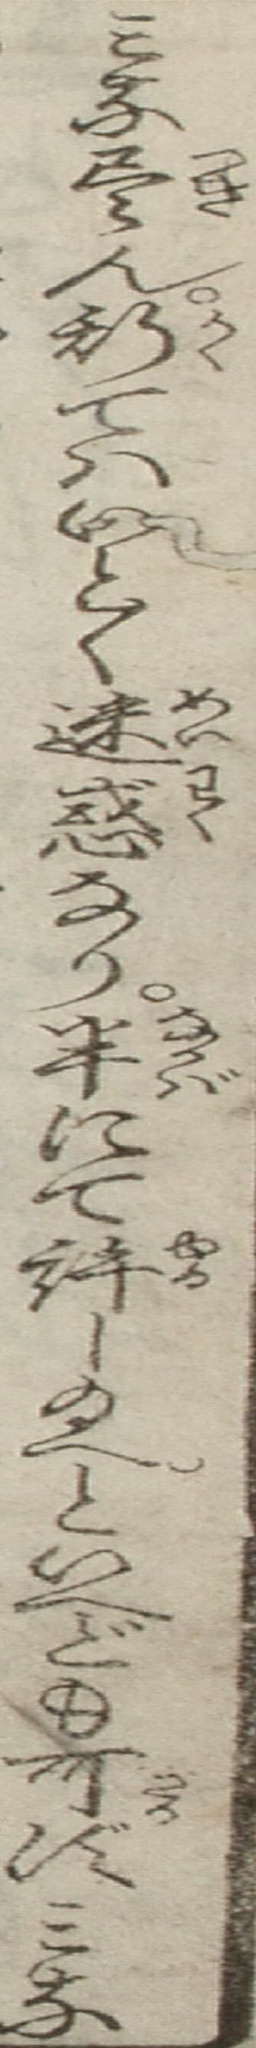みな尽ん。斯てはいと〳〵迷惑なり。半にて許し給へ。といへども可ずみな
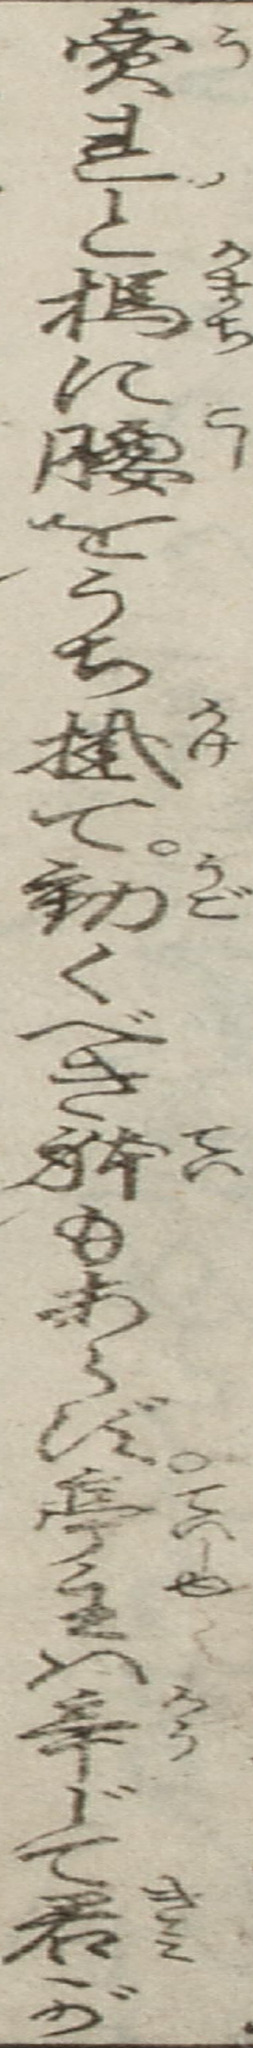売れ。と框に腰をうち掛て。動くべき体もあらず。亭主は辛じて君が
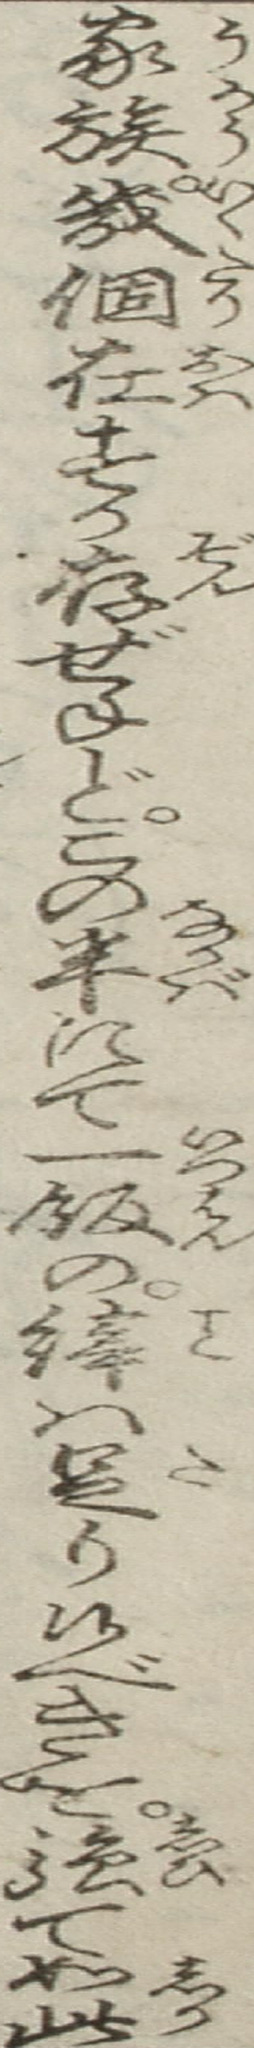家族幾個在すか存ぜねど。この半にて一飯の縡は足り候べきを。強て如此
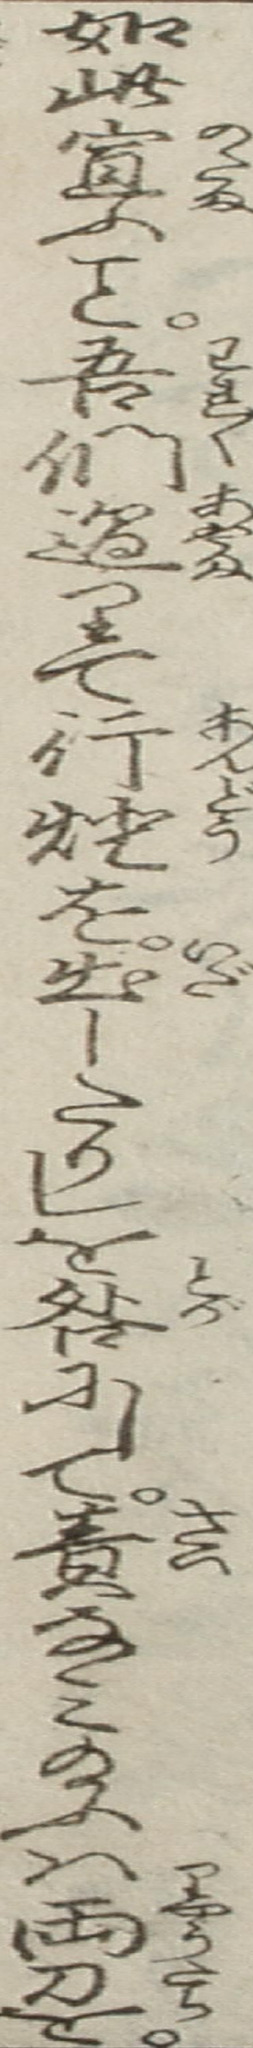如此宣ふこと。吾們過りて行燈を。出したりしを咎にして。責なみ給ふは両刀を。
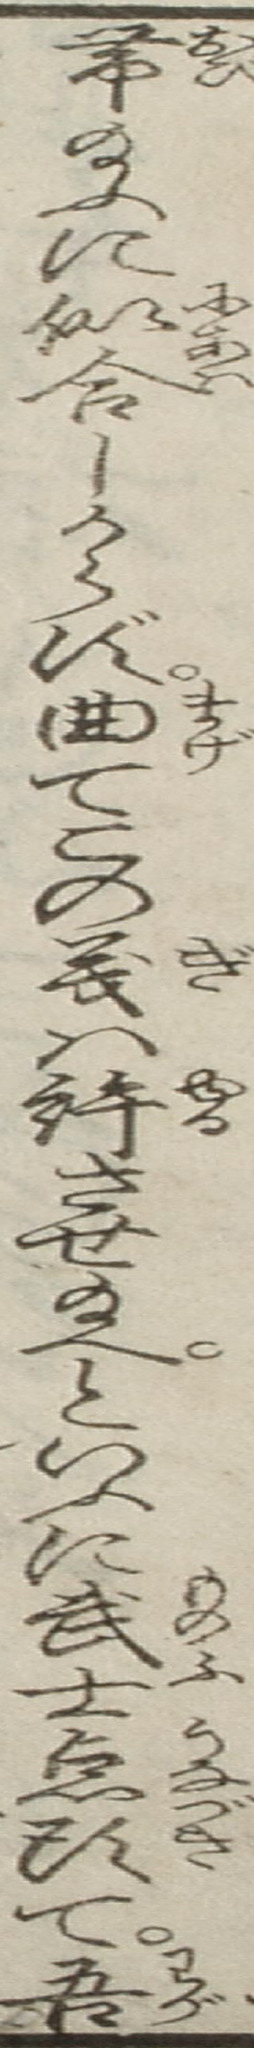帯給ふに似合しからず。曲てこの義は許させ給へ。といふに武士点頭て。吾
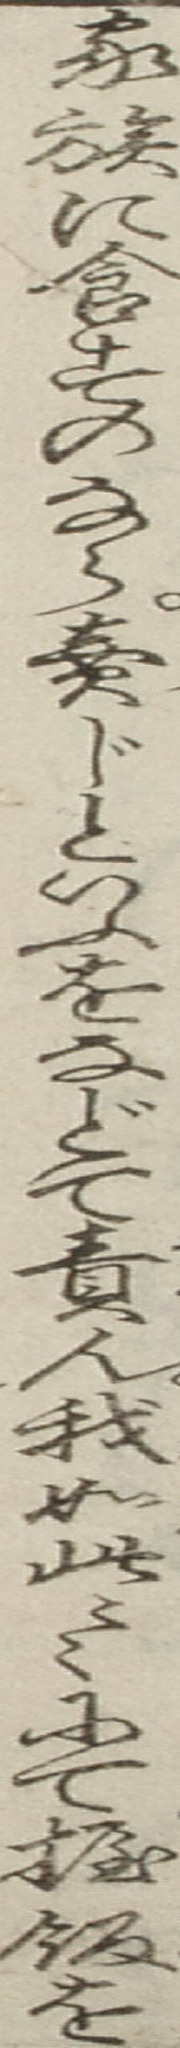家族に食すのなら。売じといふをなどて責ん。我如此〻〻にて握飯を
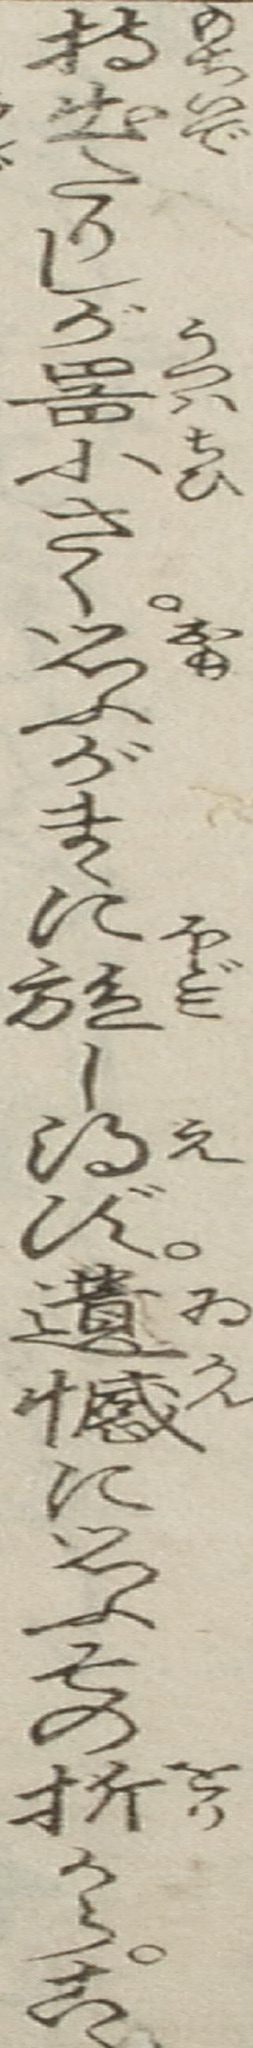持出たりしが器小さく。思ふがまゝに施し得ず。遺憾に思ふその折から。こゝ
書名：安政見聞録　上
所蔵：東京大学地震研究所図書室 Earthquake Research Institute Library, The University of Tokyo, JAPAN
